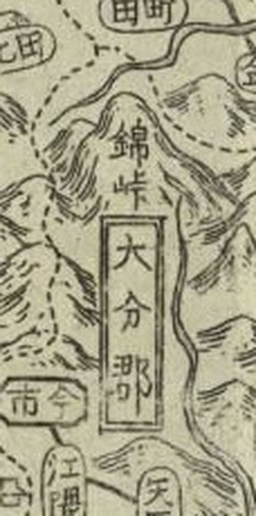大分郡
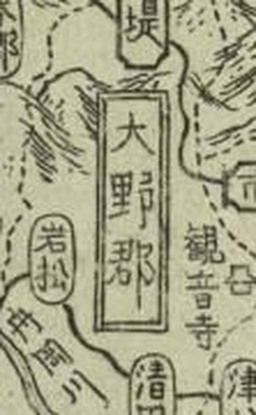大野郡
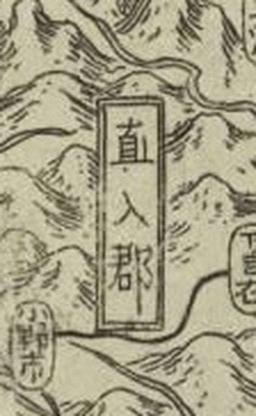直入郡
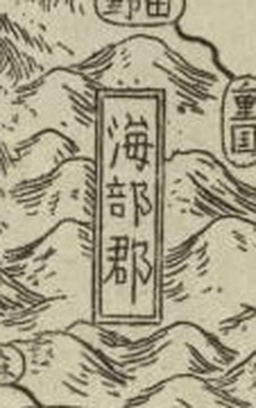海部郡

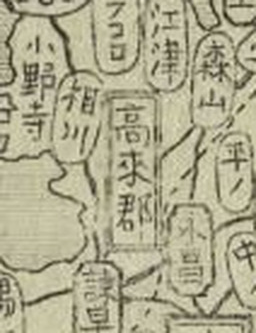高來郡

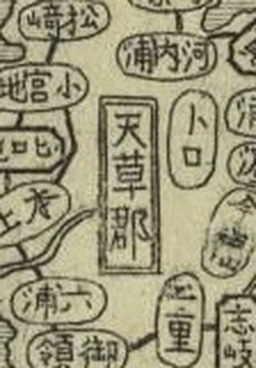天草郡
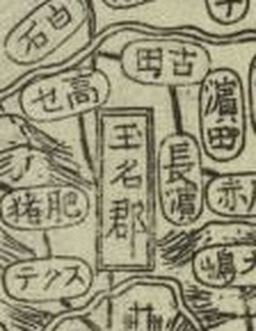玉名郡
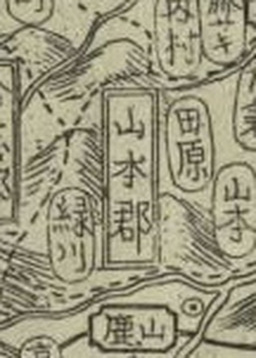山本郡
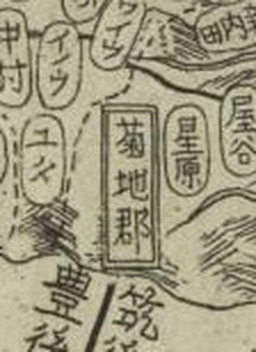菊池郡
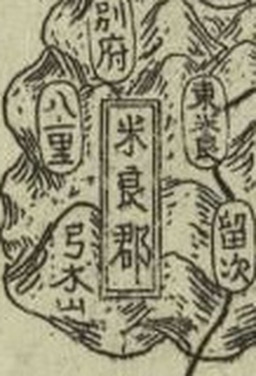米良郡

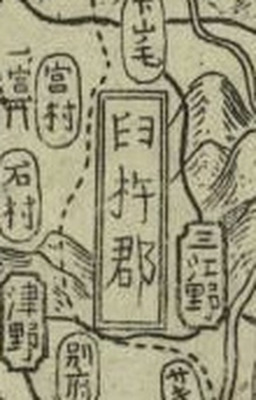臼杵郡
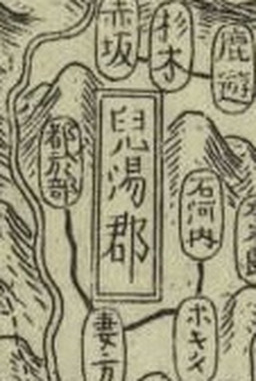兒湯郡
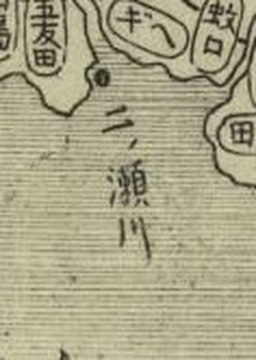●二の瀬川
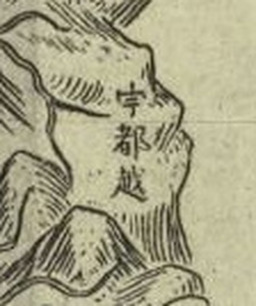宇都越
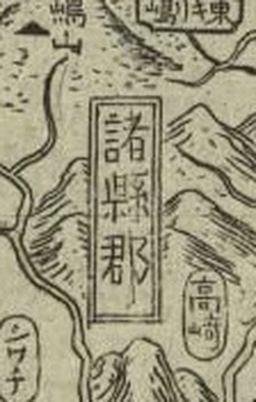諸縣郡
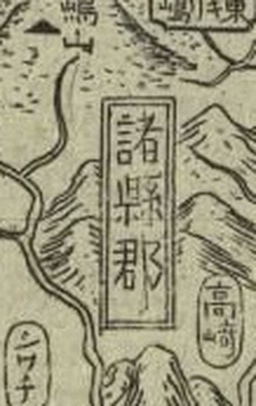諸縣郡
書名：大日本国細図 西国之部 下
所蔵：University of the Ryukyus Library
